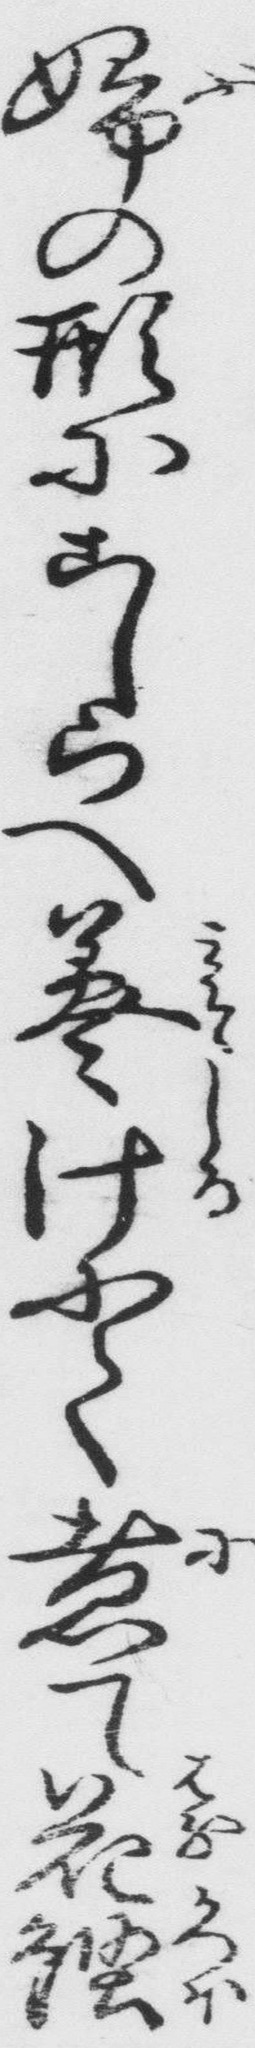婦の形にこしらへ羹汁にて煮て花鰹

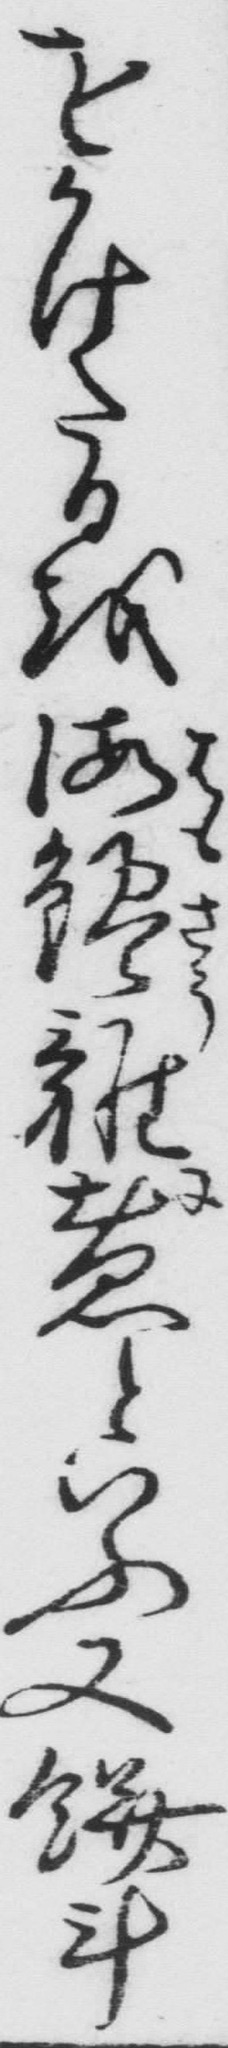をかけたるを海鱧雑煮といふ又餅斗
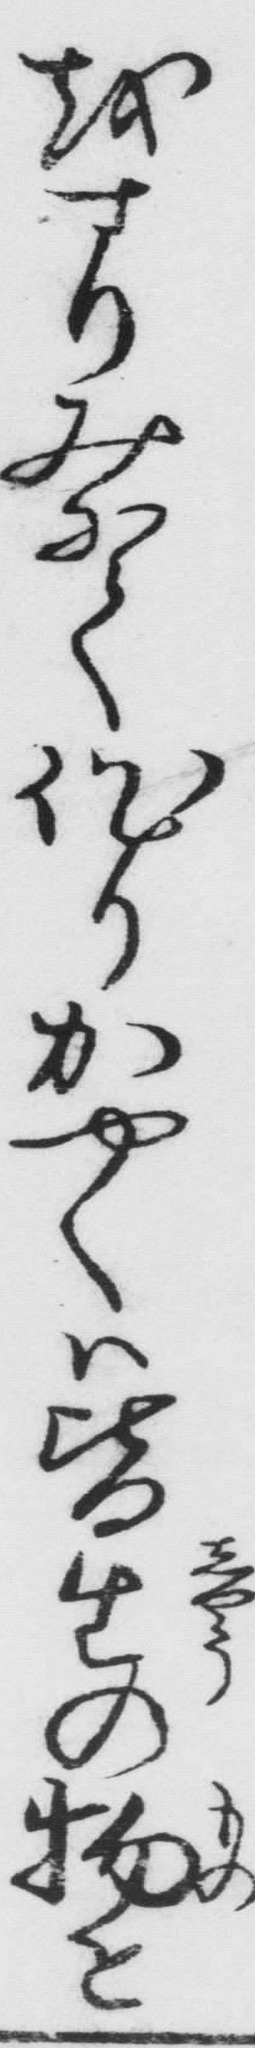をすりみにて作りかやくは皆生の物を
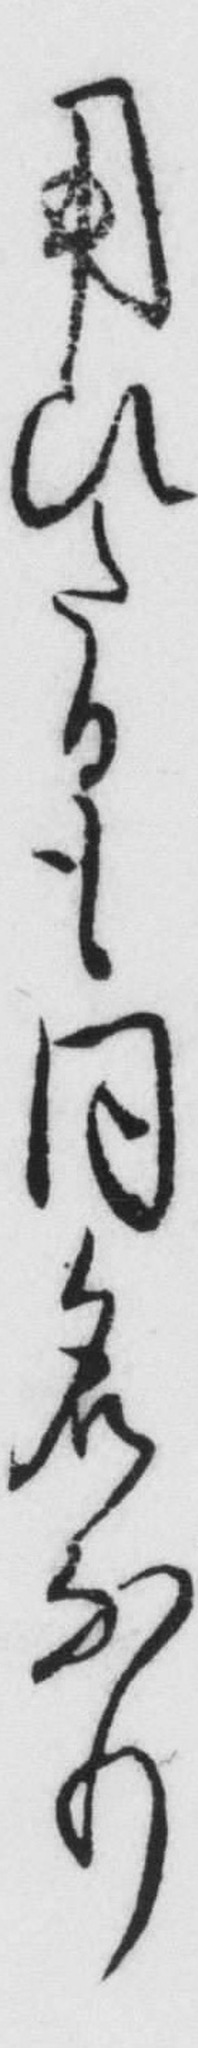用ひたるも同名なり
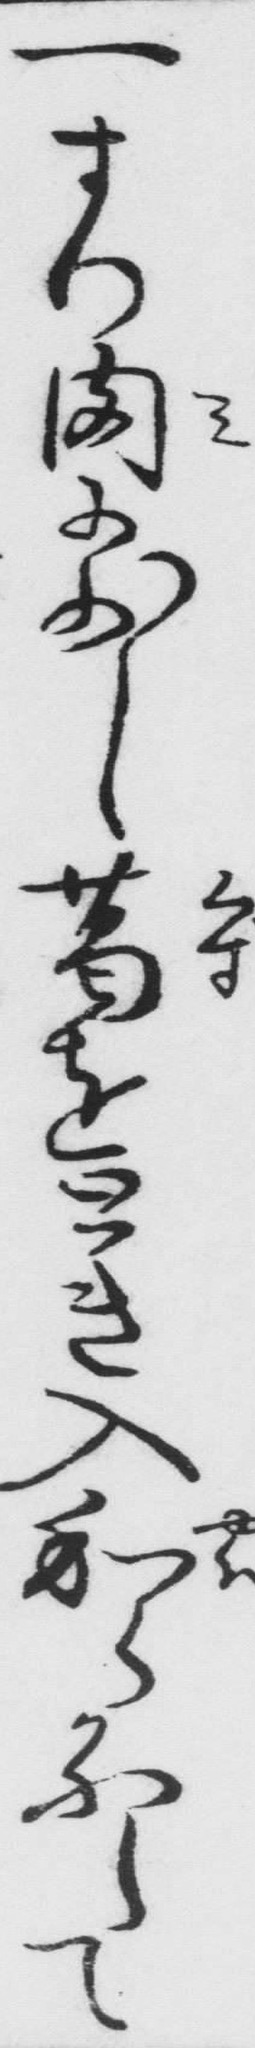一すり肉に少し葛をとき入和らかにして
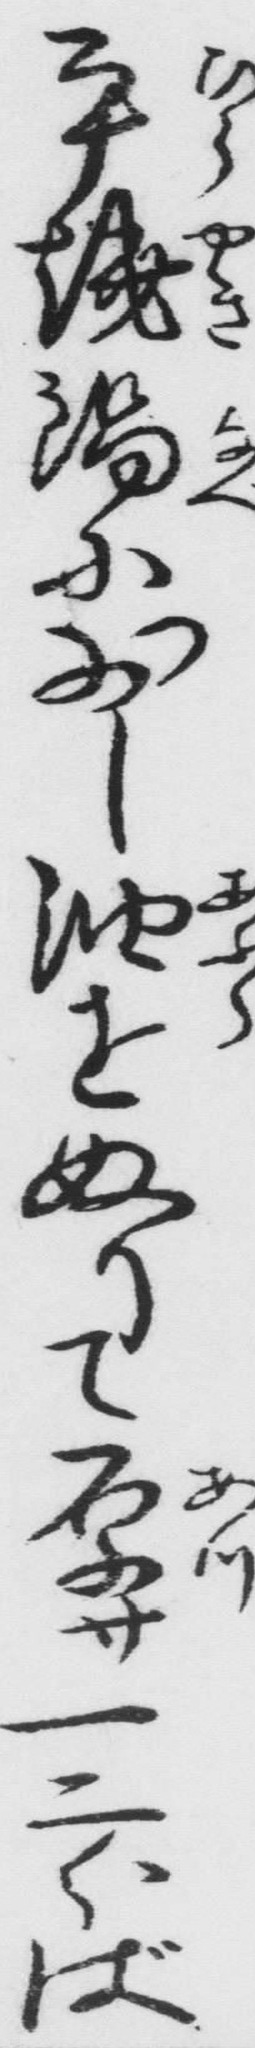平燒鍋に少し油をぬりて厚さ一二分ば
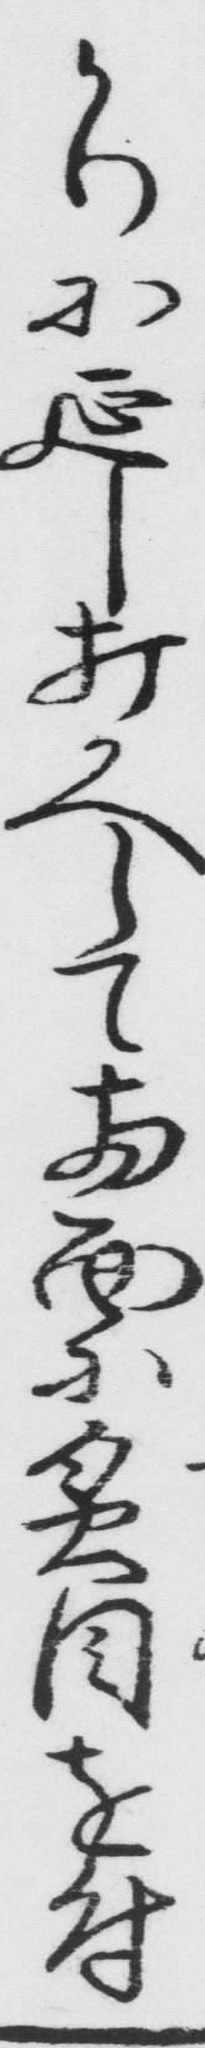かりに延し打かへして両面に炙目を付
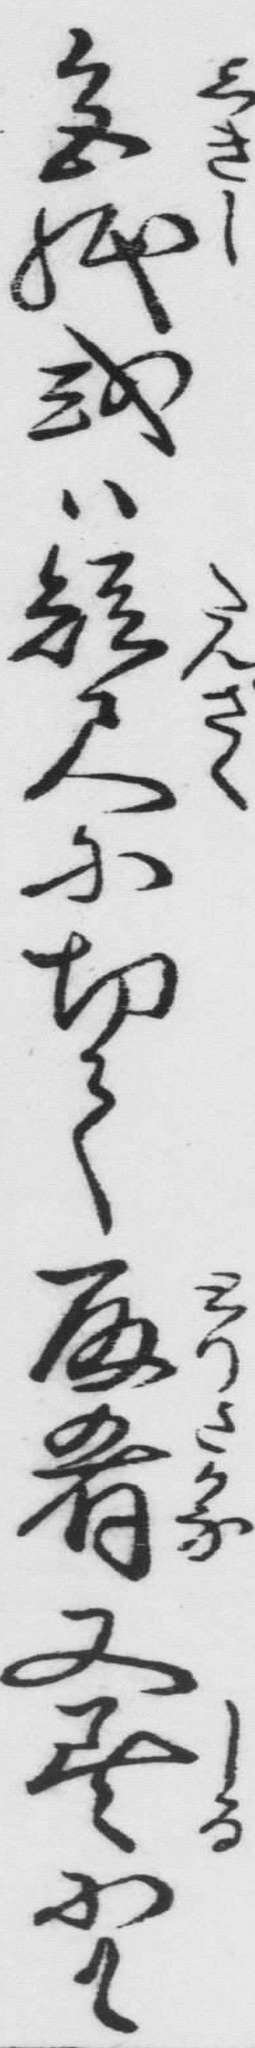色紙或は短尺に切て取肴又羹にて
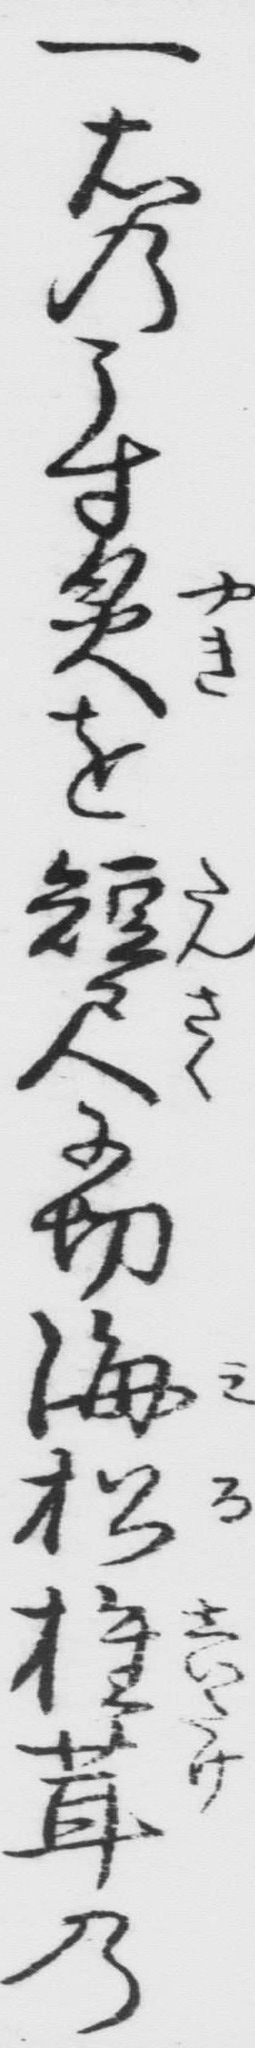一右のうす炙を短尺に切海松椎茸の
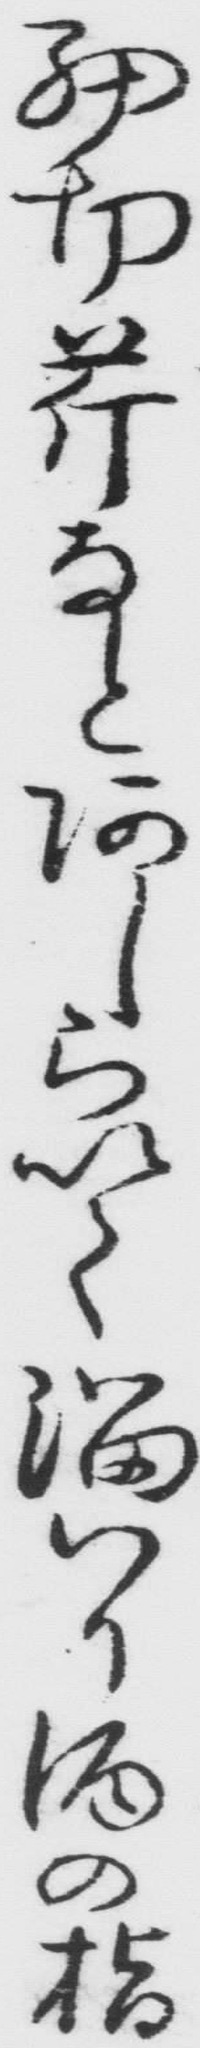細切芹なとあしらいて溜いり酒の指
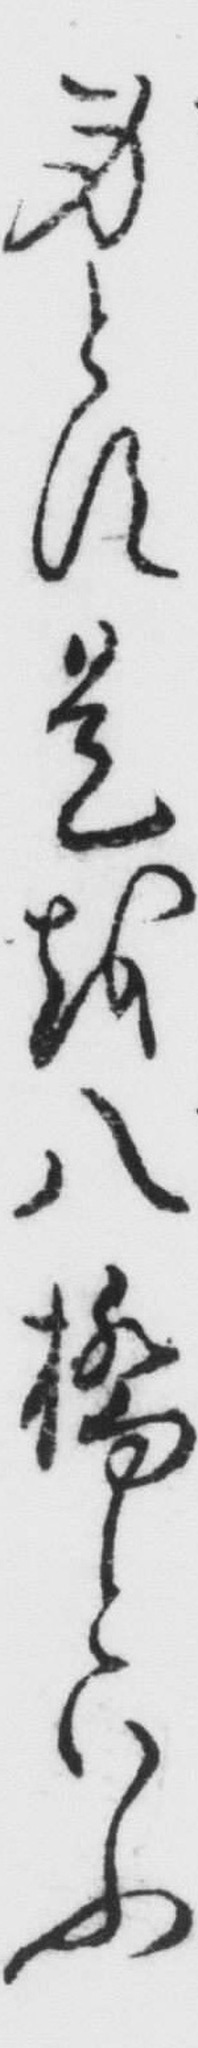身とす是を八橋といふ
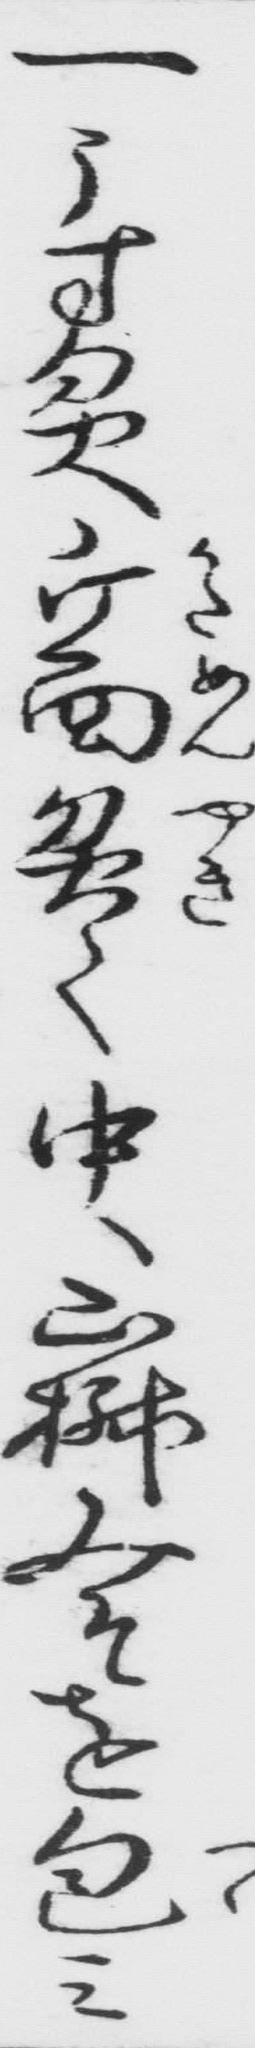一うす炙片面炙て中へ山椒みそを包み
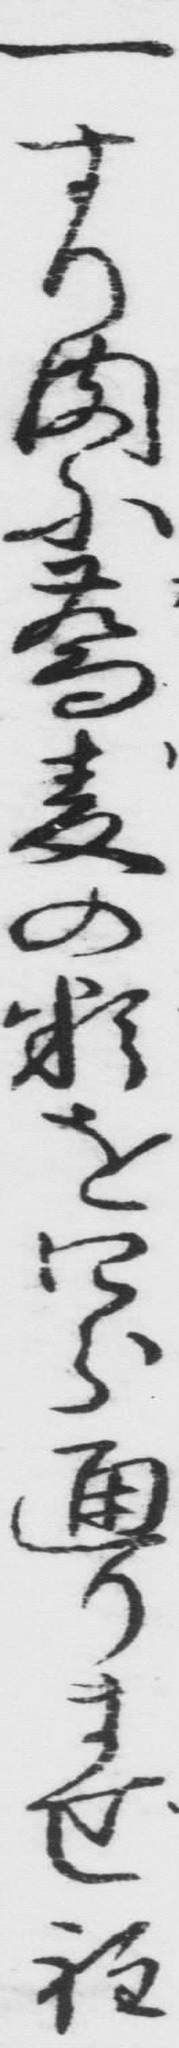一すり肉に蕎麦の粉を四分通りまぜ程

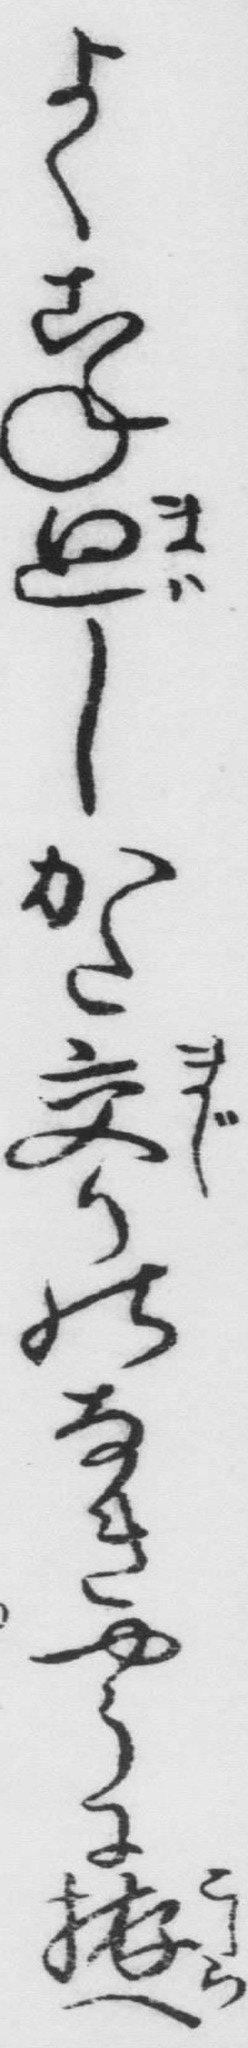よくこね廻しかた交りのなきやうに拵へ
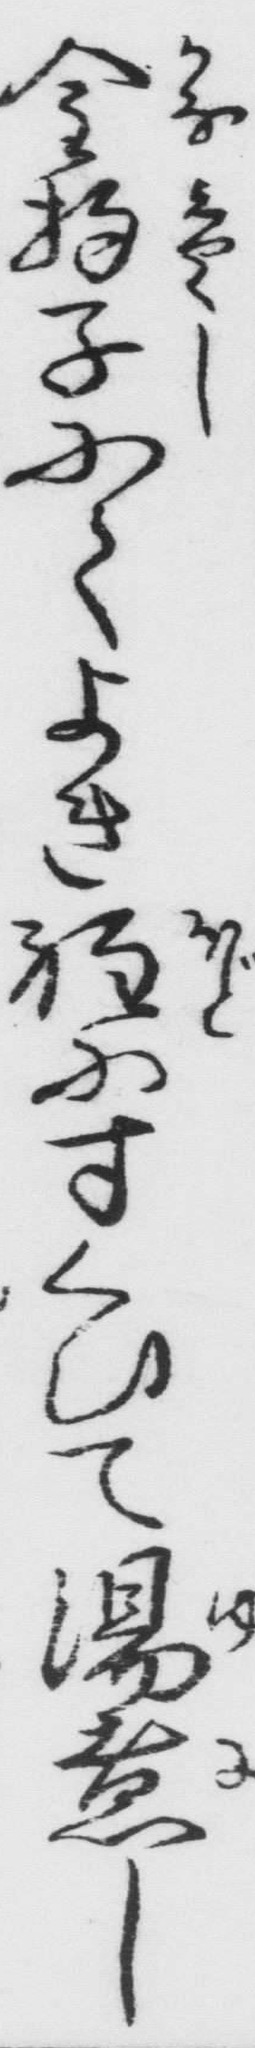金杓子にてよき程にすくひて湯煮し
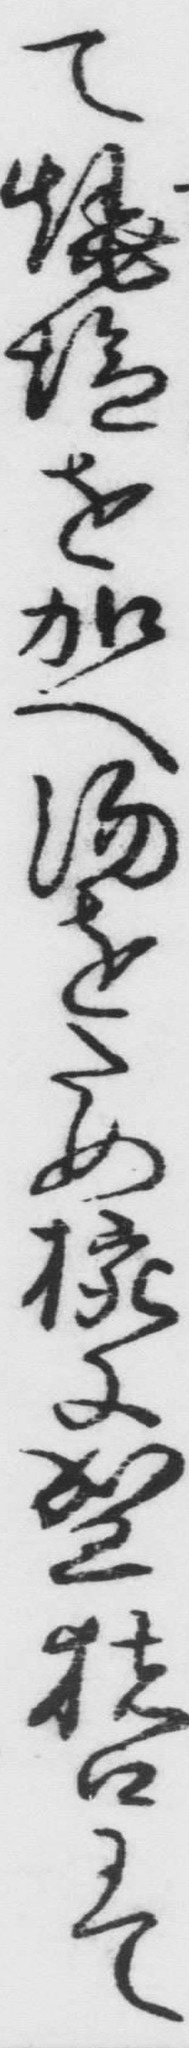て燒塩を加へ湯をため椀に盛猪口にて
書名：海鰻百珍
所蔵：大阪府立大学学術情報センター 国文学研究資料館
